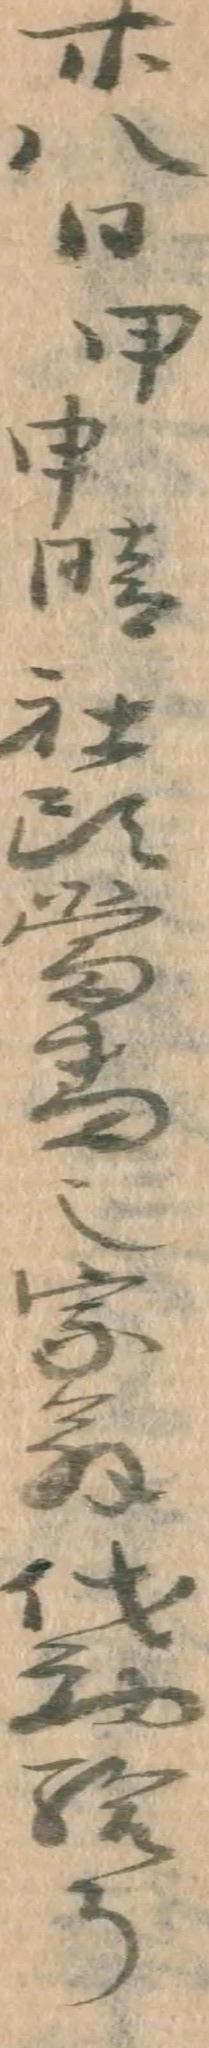廿八日甲申晴、社頭當番也、家翁代勤給了、
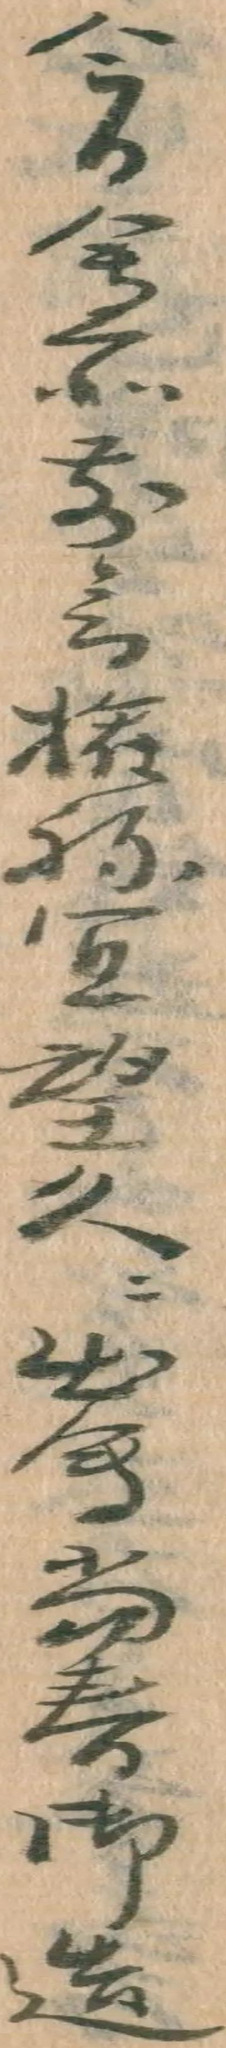今日會所前ニ而権祢宜望久ニ出會、當春御造
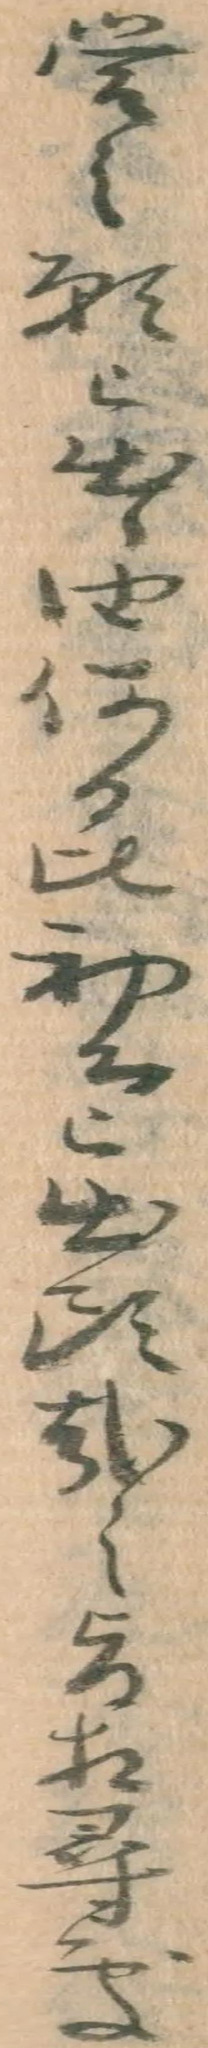営之願被出候由、何日比初而被出頭哉之旨相尋候處、
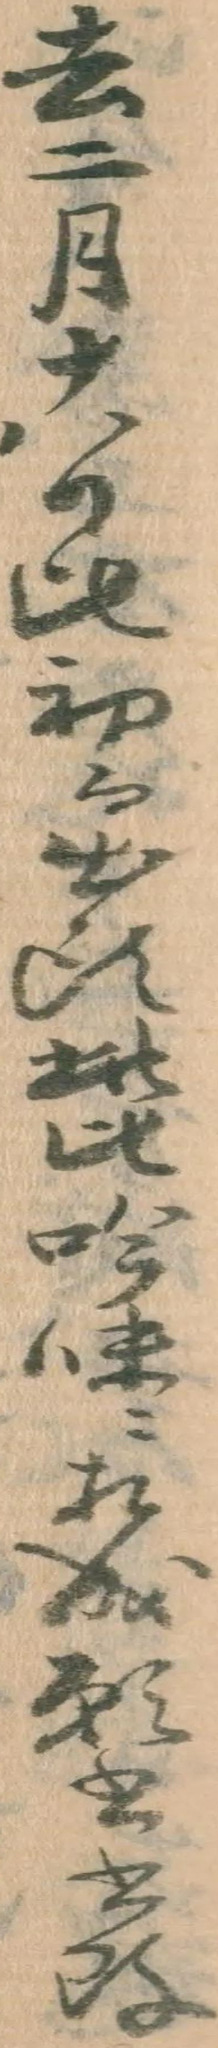去二月十八日比初而出頭、此頃吟味二相成、願書書改
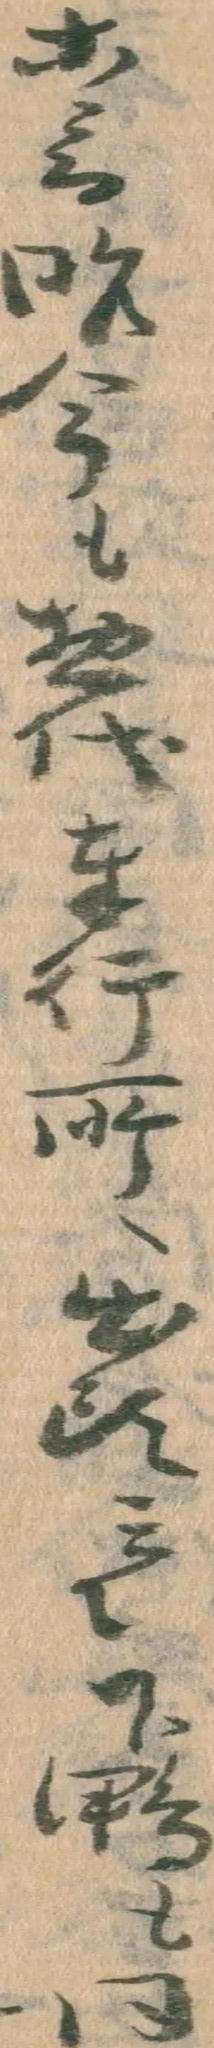等ニ而、昨今も惣代奉行所へ出頭云々、下鴨も同
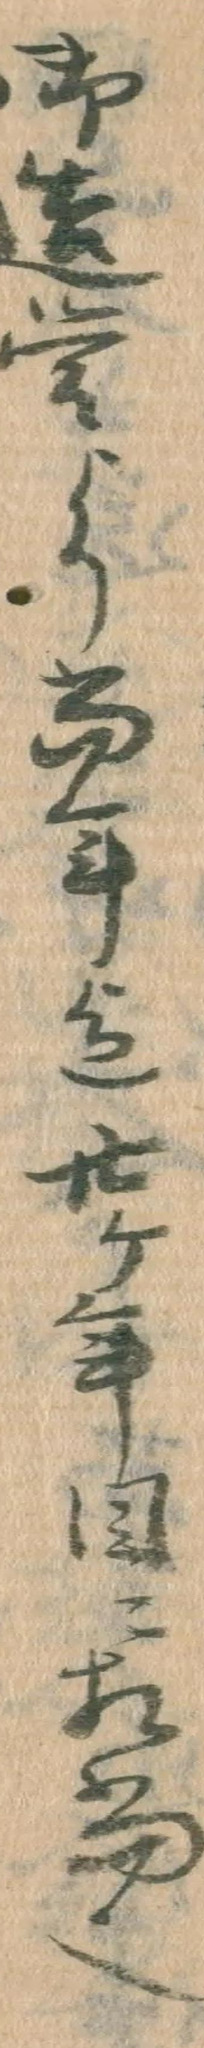御造営より當年迄廿ヶ年目に相當也、
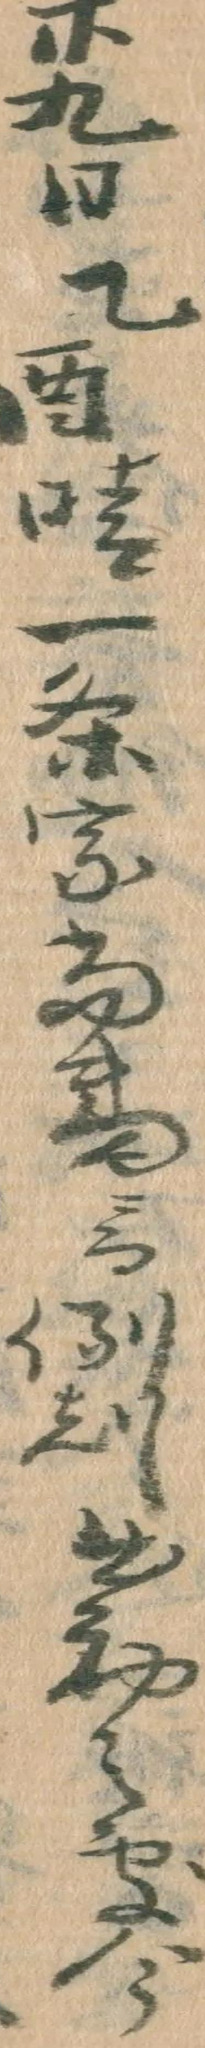廿九日乙酉晴、一条家當番ニ而、例刻出勤之處、今
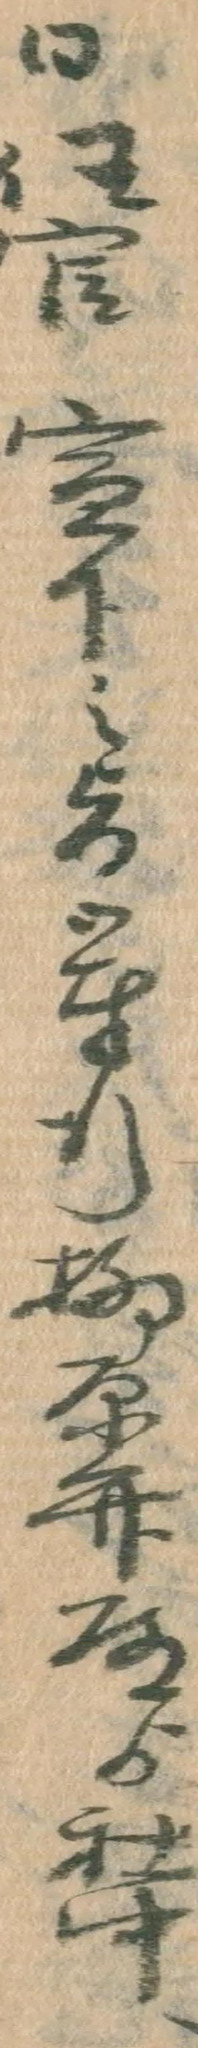日任官宣下之旨御奉行柳原弁殿ゟ社中へ
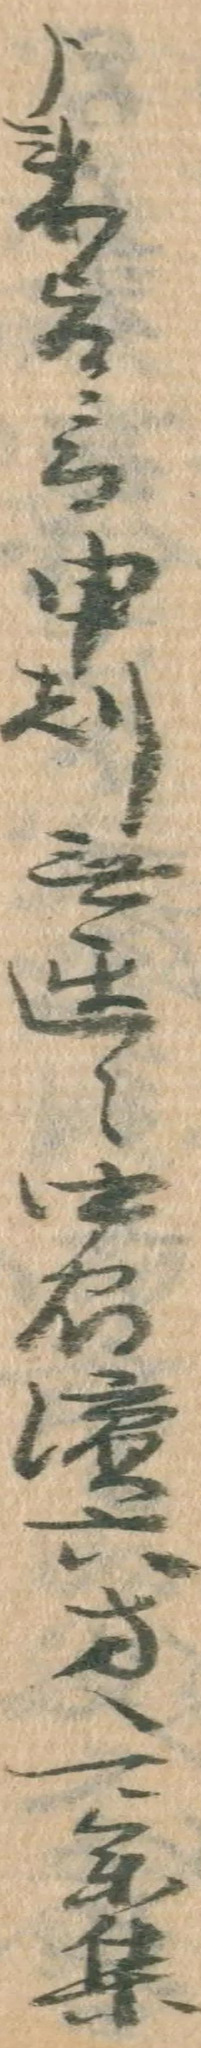申来旨ニ而、申刻無遅之中宿濱六方へ可参集
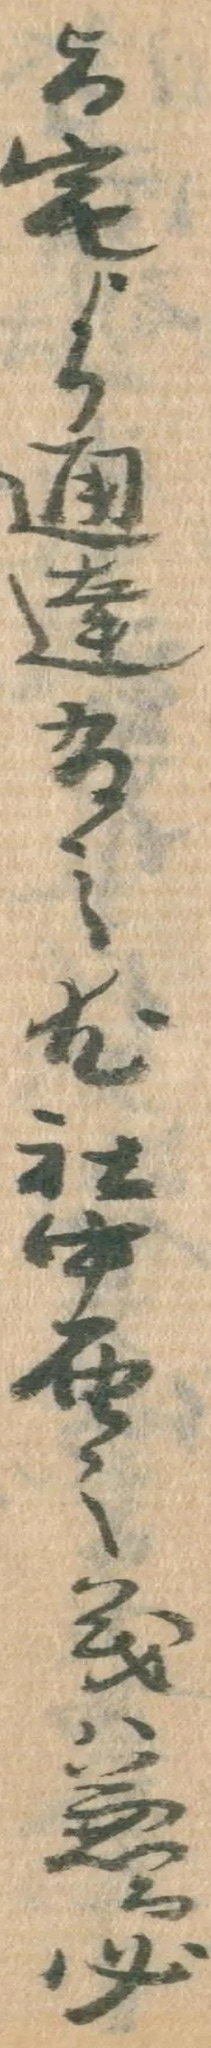旨宅より通達有之、尤社中届之義ハ、兼而必
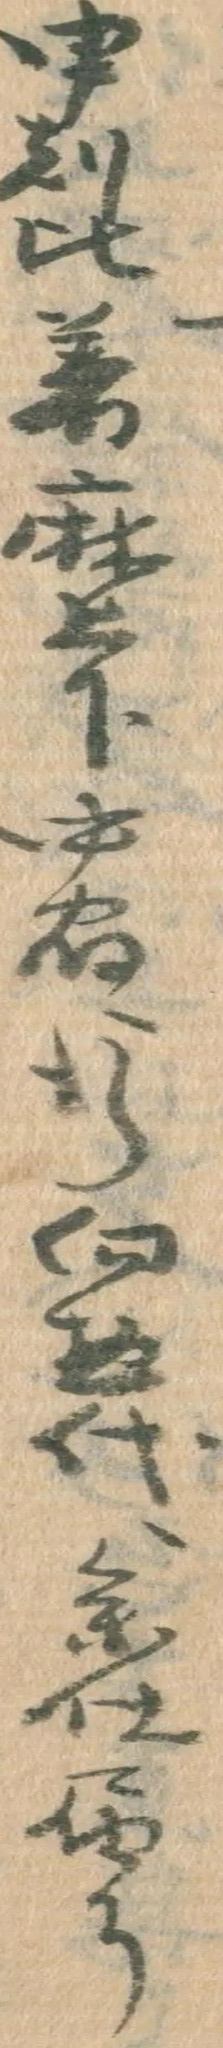申刻頃着麻上下中宿へ行向、惣代へ参仕届より
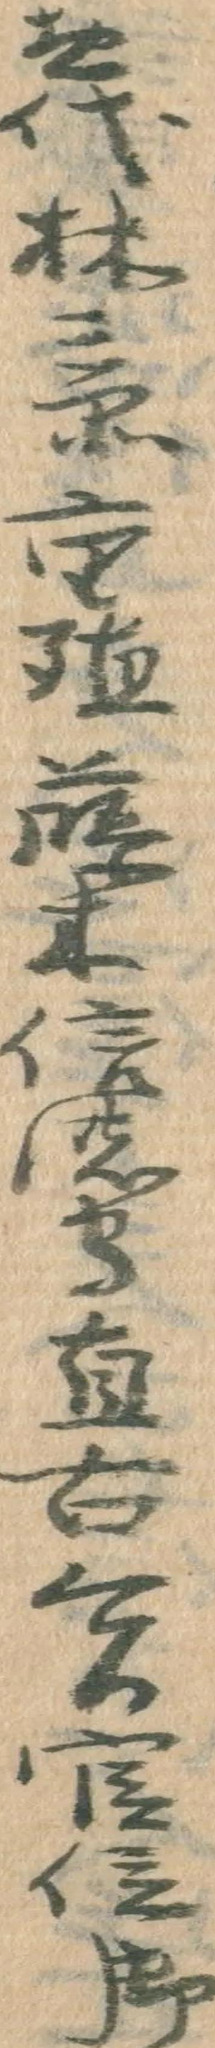惣代林三品重殖・藤木信濃守直古、今日官位御

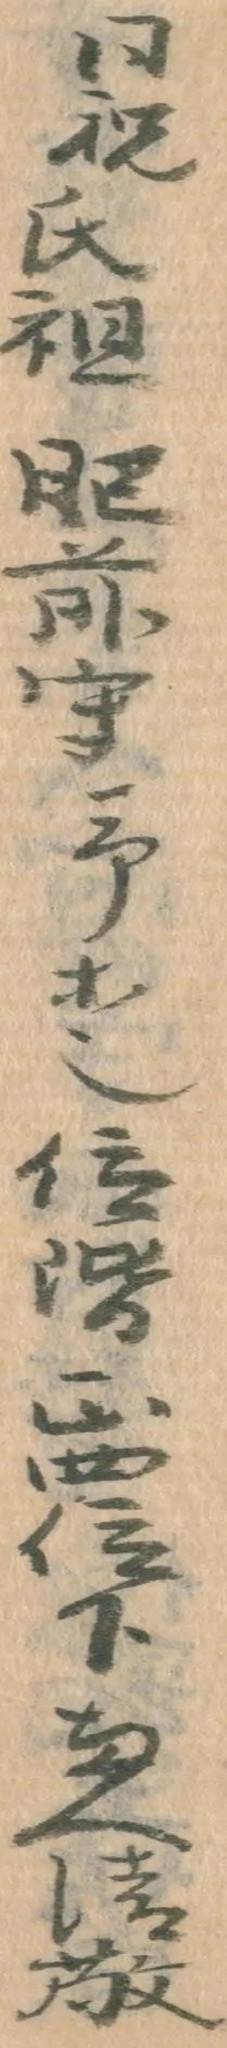同祝氏祖・肥前守予等也、位階正四位下両人、清敬
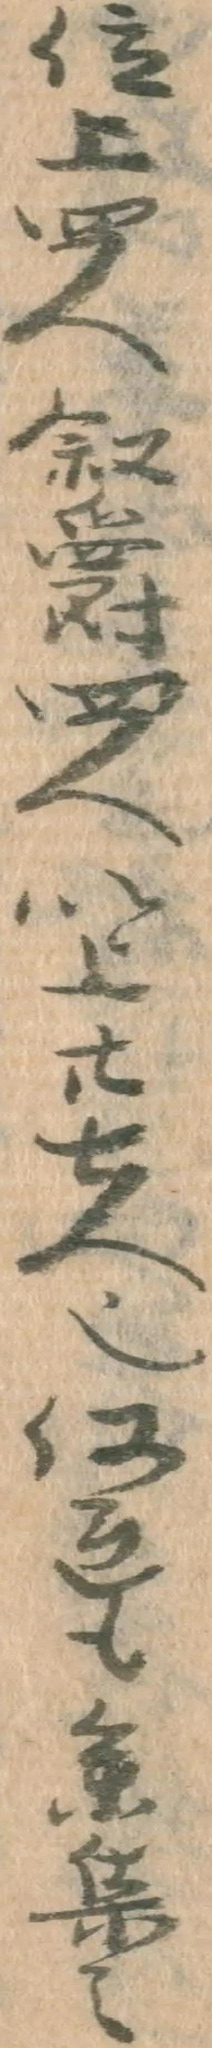位上四人、叙爵四人、以上廿七人也、何れも参集之
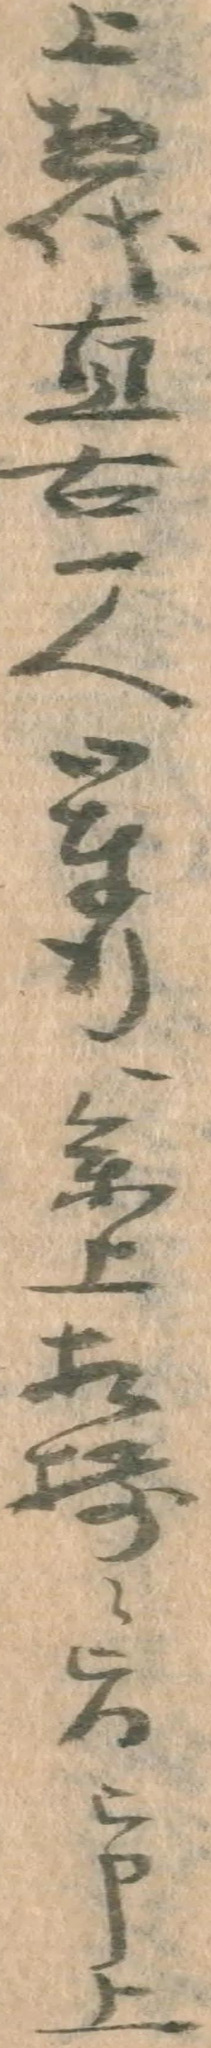上、惣代直右一人御奉行へ参上、相聞候旨被申上
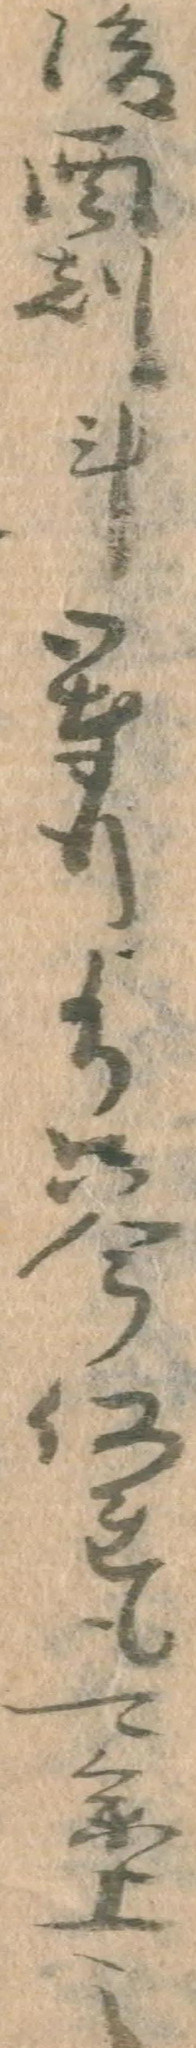後、酉刻計御奉行より只今何れも可参上之
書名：賀茂社記録. 第63冊
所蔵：国立国会図書館 National Diet Library, JAPAN
